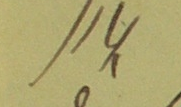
114
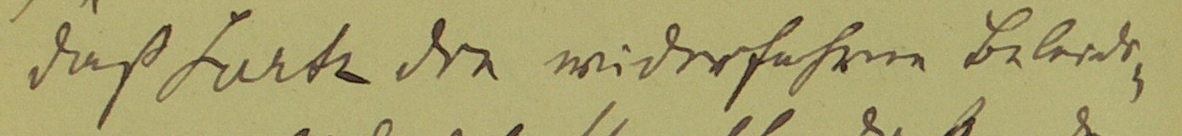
daß Lurtz die widerfahrene Beleidi¬
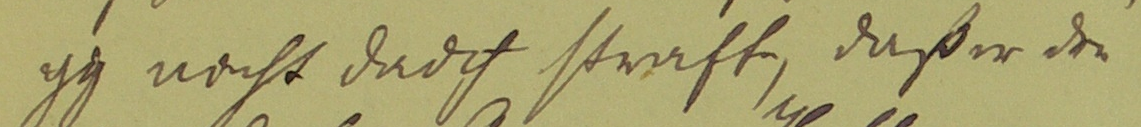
gung nicht dadurch straft, daß er den
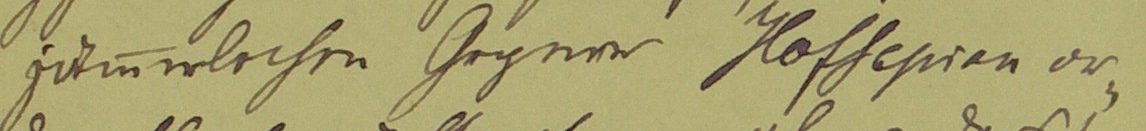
jämerlichen Gegner Hofsepian or¬
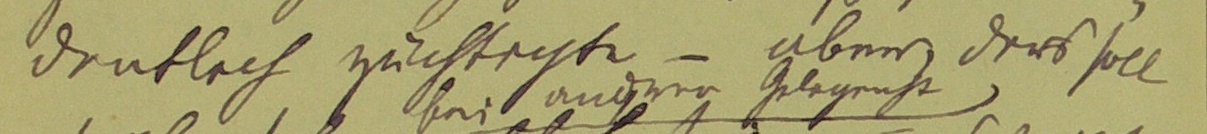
dentlich züchtigte ,- aber das soll
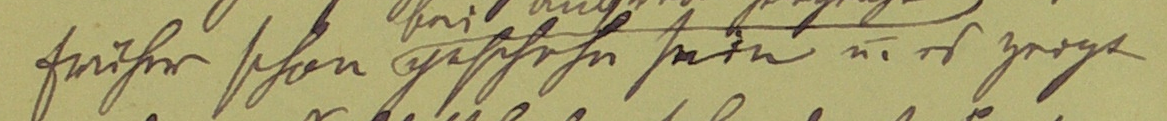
früher schon geschehen sein u. es zeugt
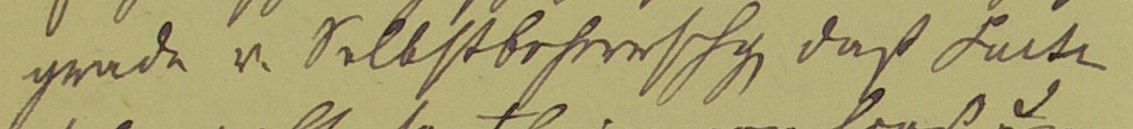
gerade von Selbstbeherrschung, daß Lurtz
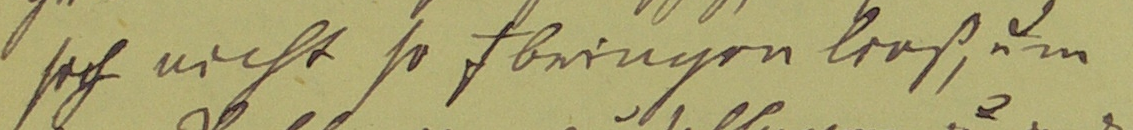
sich nicht so fbringen ließ, um
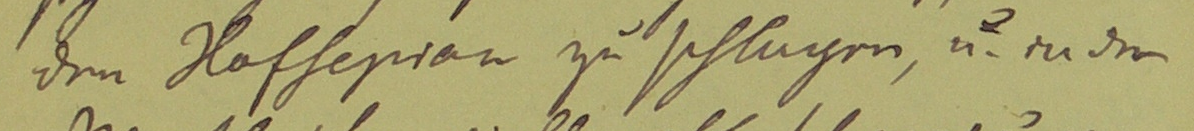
den Hofsepian zu schlagen, u. in der
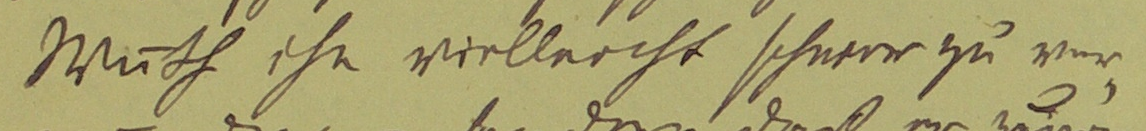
Wuth ihn vielleicht schwer zu ver¬
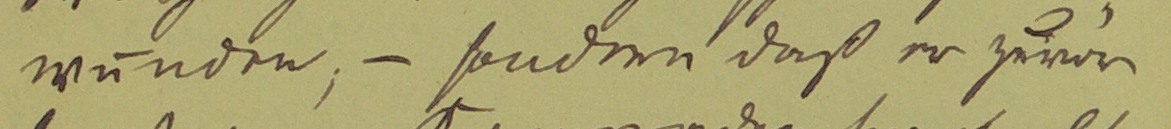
wunden; - sondern daß er zuvor
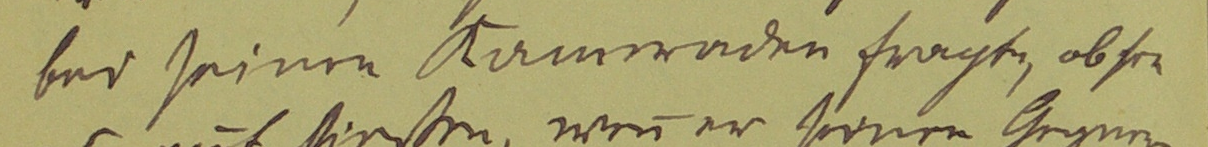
bei seinen Kameraden fragte, ob sie
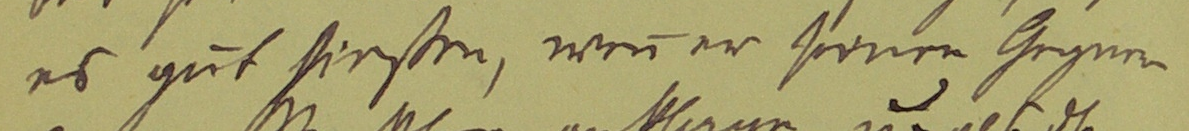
es gut finden, wenn er seinen Gegner
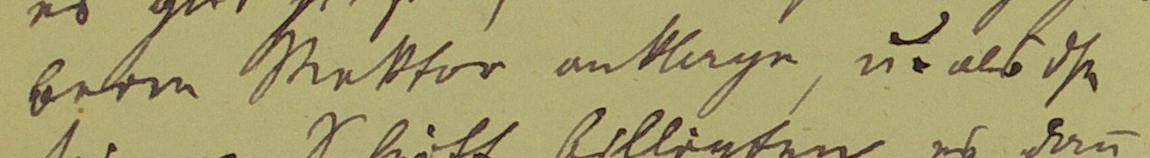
beim Rektor anklagen, u. als dse
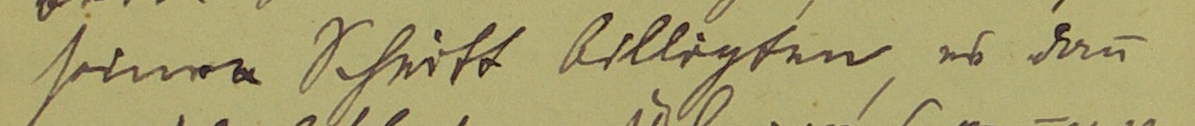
seinen Schritt billigten, es dan
